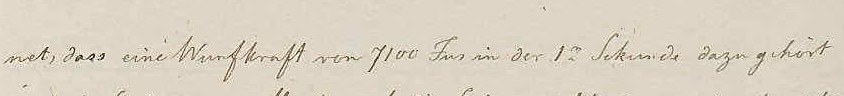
net, dass eine Wurfkraft von 7100 Fus in der 1￼ Sekunde dazu gehört
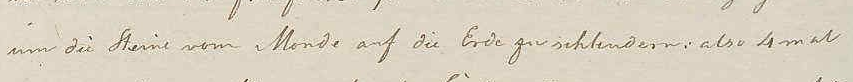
um die Steine vom Monde auf die Erde zu schleudern: also 4 mal
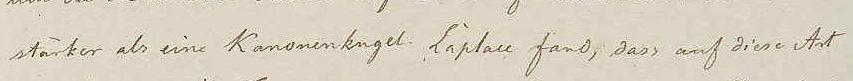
stärker als eine Kanonenkugel. Laplace fand, dass auf diese Art
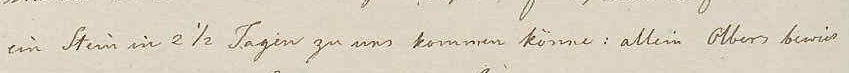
ein Stein in 2½ Tagen zu uns kommen könne: allein Olbers bewies
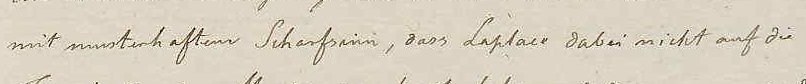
mit musterhaften Scharfsinn, dass Laplace dabei nicht auf die
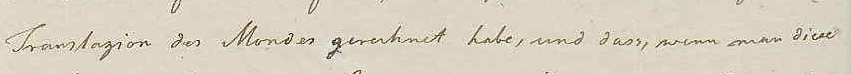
Translazion des Mondes gerechnet habe, und dass, wenn man diese
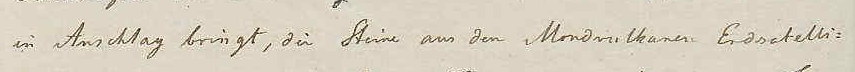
in Anschlag bringt, die Steine aus den Mondvulkanen Erdsatelli-
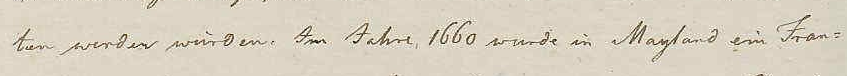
ten werden würden. Im Jahre 1660 wurde in Mayland ein Fran-
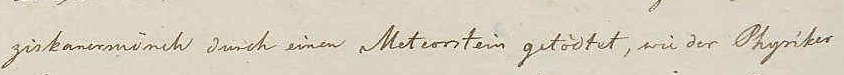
ziskanermönch durch einen Meteorstein getödtet, wie der Physiker
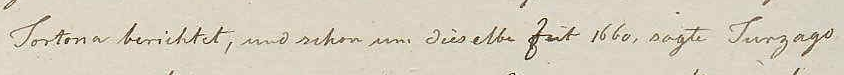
Tortona berichtet, und schon um dieselbe Zeit 1660, sagte Turzago
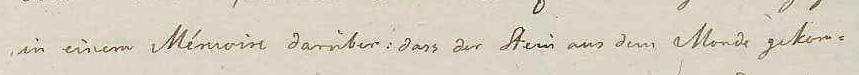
in einem Mémoire darüber: dass der Stein aus dem Monde gekom-
